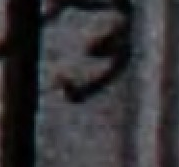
3
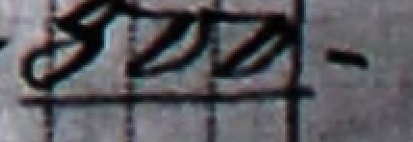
800 -
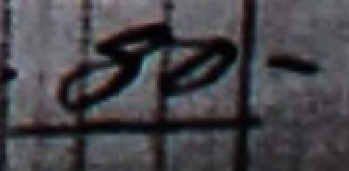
80 -
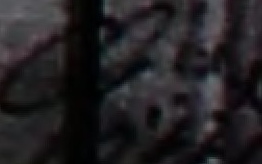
??
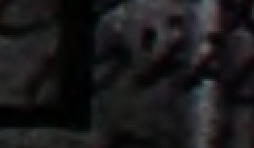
???
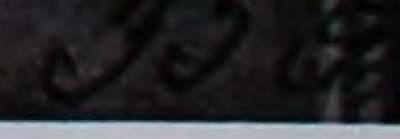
???
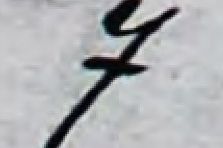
7
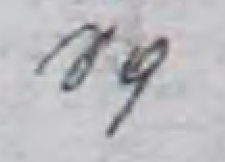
s 9
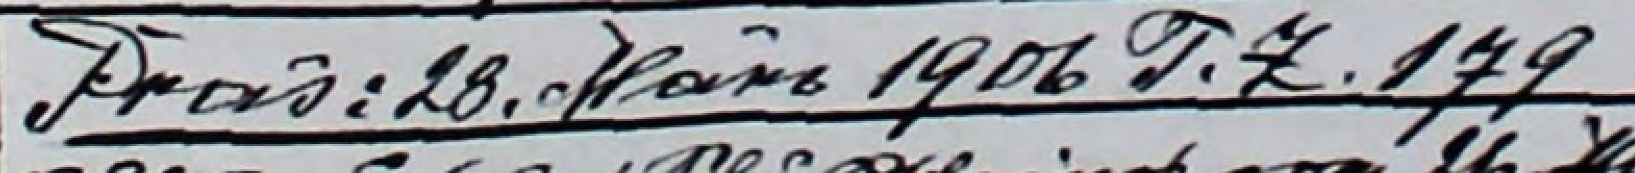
Präs: 28. März 1906 T.Z. 179
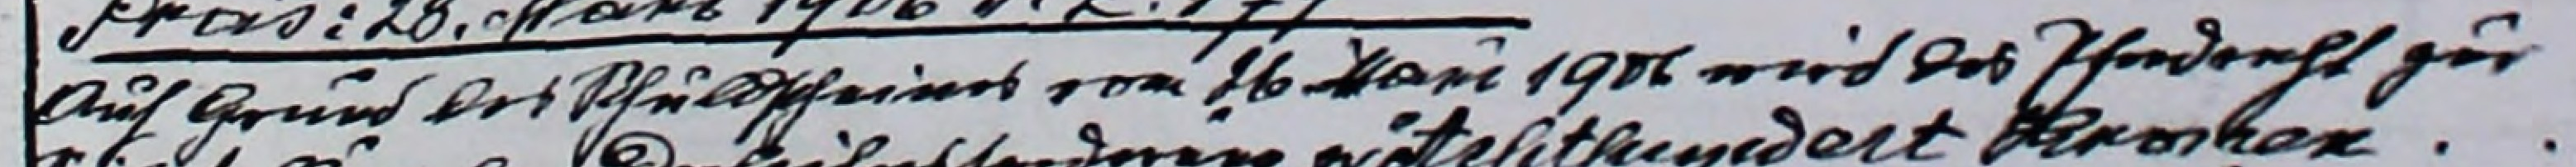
Auf Grund des Schuldscheines vom 26. März 1906 wird das Pfandrecht zur
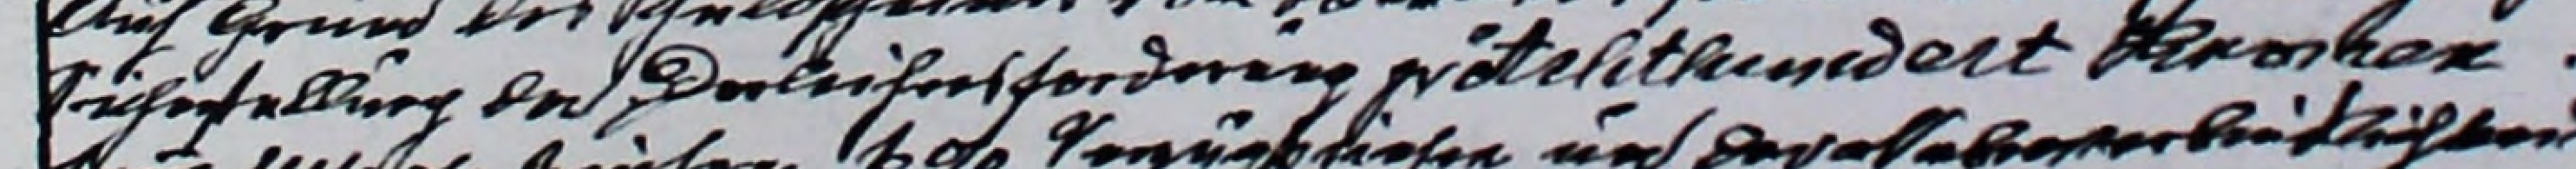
Sicherstellung der Darleihensforderung pr Achthundert Kronen
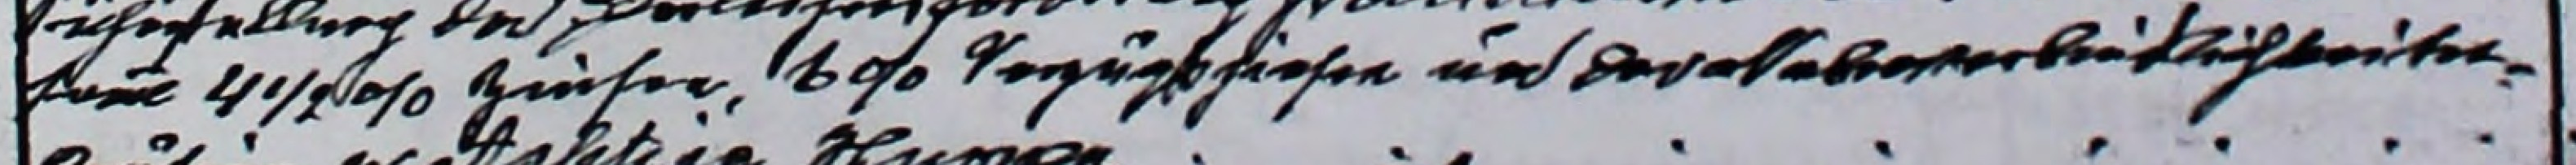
sammt 4 1/2 % Zinsen, 690 Verzugszinsen und der Nebenverbindlichkeiten -
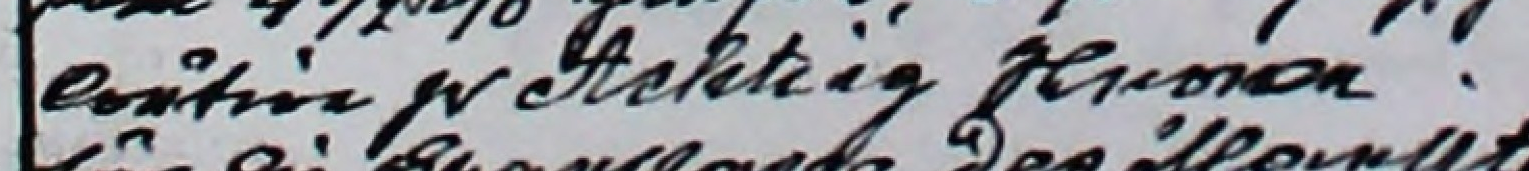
Caution pr Achtzig Kronen.
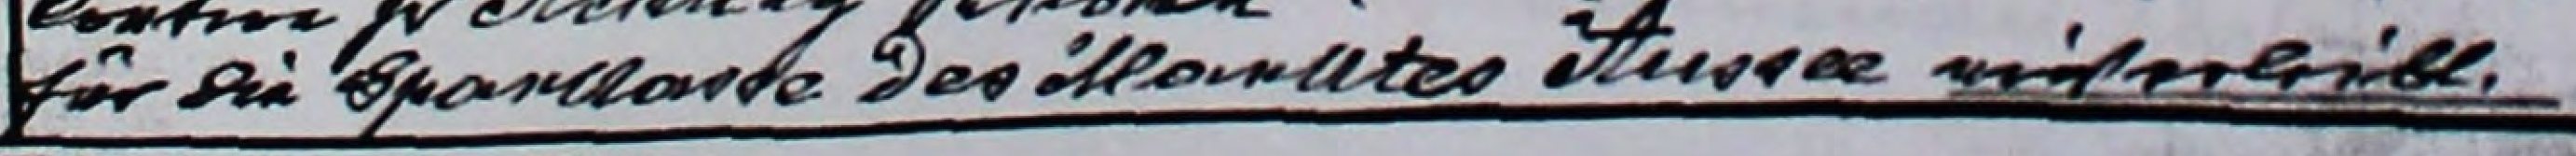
für die Sparkasse des Marktes Aussee einverleibt.
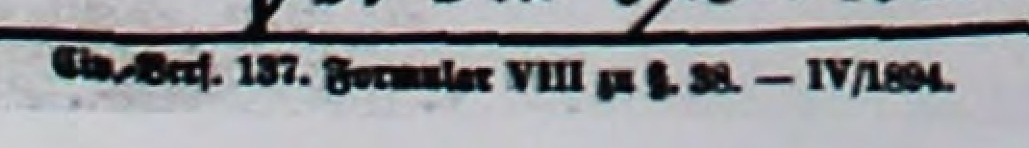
Ein=???. 137. Formular VIII zu ?. 38. - IV/1894.
